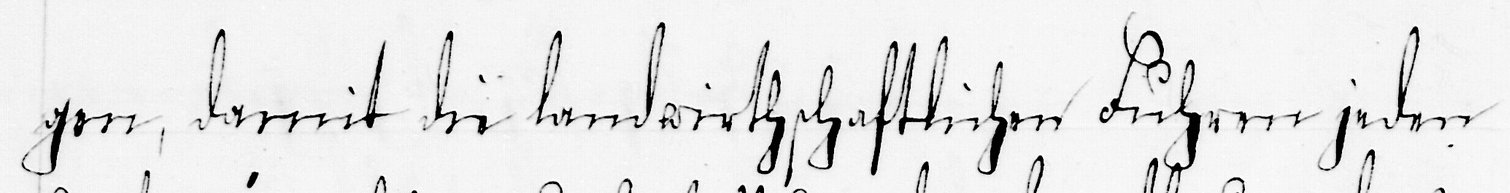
gen, damit die landwirthschaftlichen Fuhren jeden
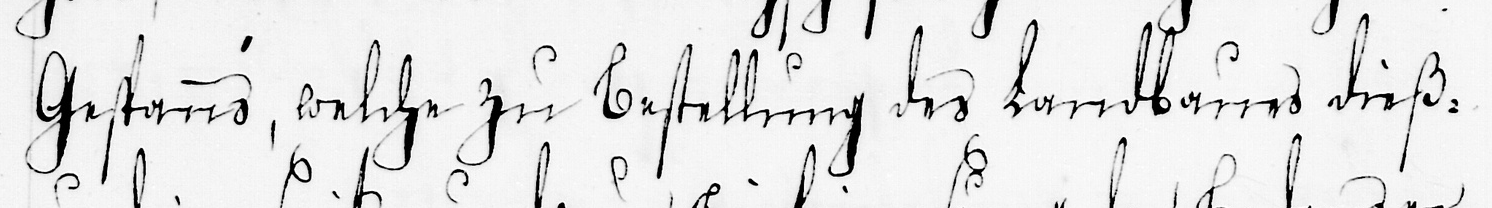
Gespanns, welche zu Bestellung des Landbaues dieß-
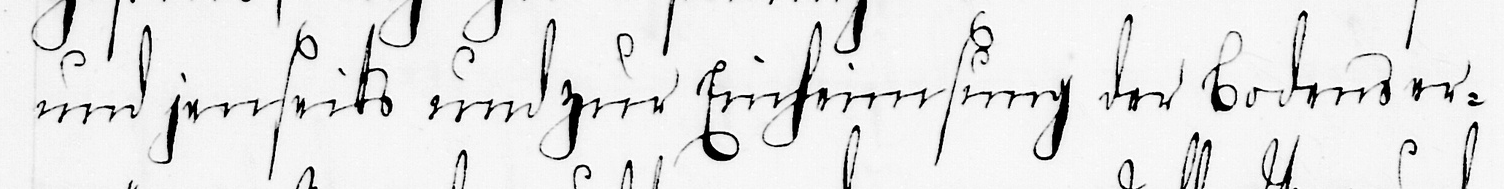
und jenseits und zur Einheimsung der Bodener¬
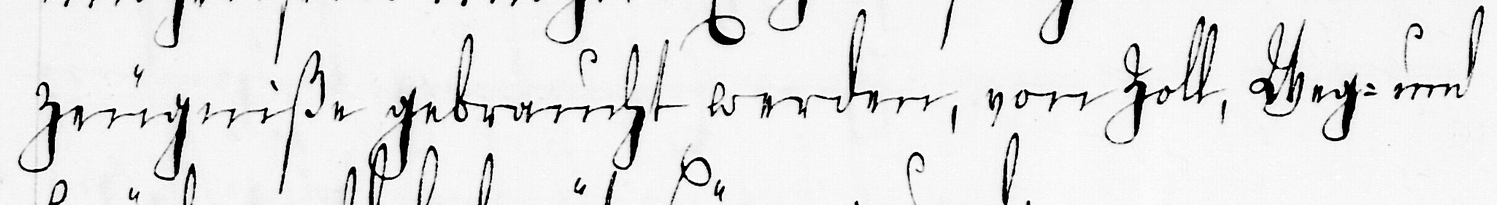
zeugniße gebraucht werden, von Zoll, Weg- und
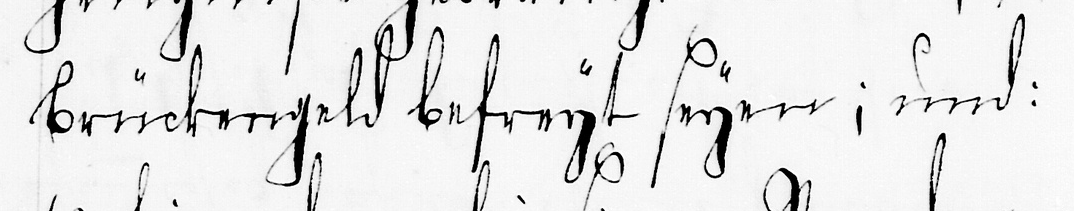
Brückengeld befreyt seyen; und:
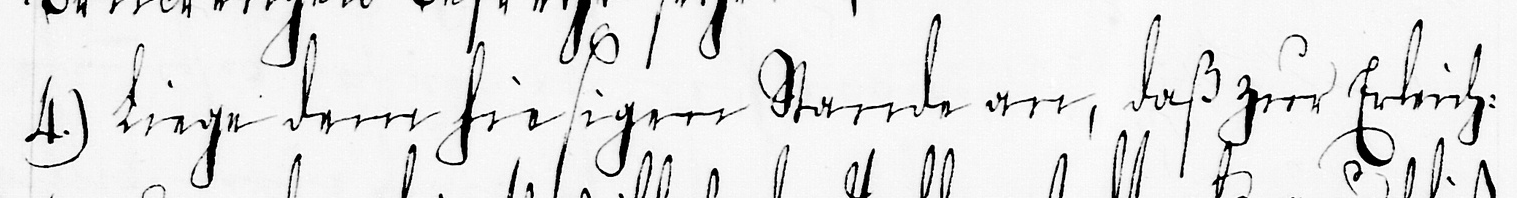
4.) Liege dem hiesigen Stande an, daß zur Erleich¬
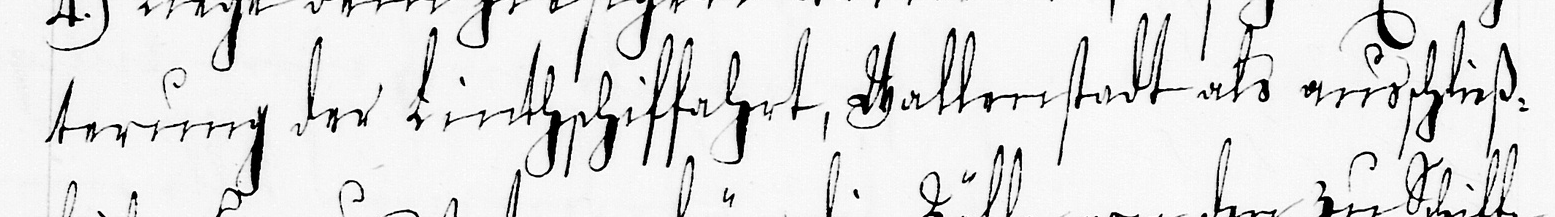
terung der Linthschiffahrt, Wallenstadt als ausschlie¬
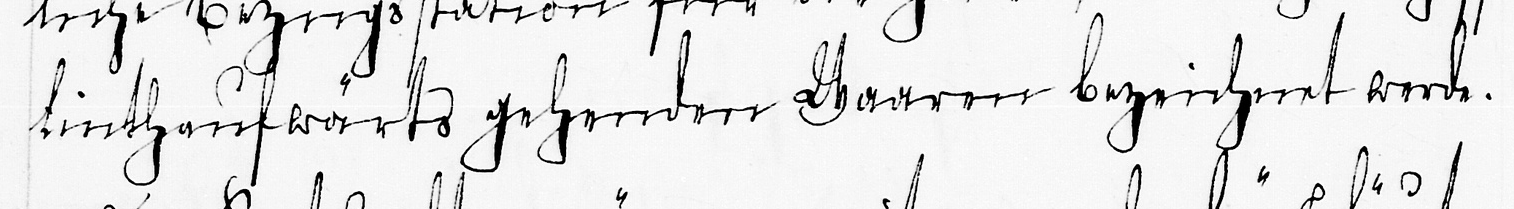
Linthaufwärts gehenden Waaren bezeichnet werde.
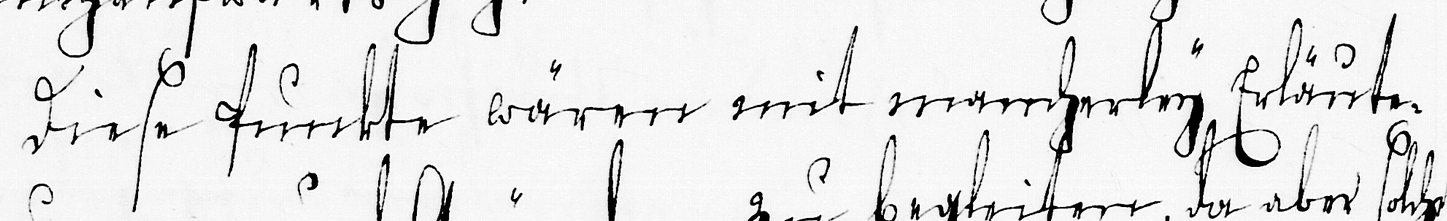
Diese Punkte wären mit mancherley Erläute¬
